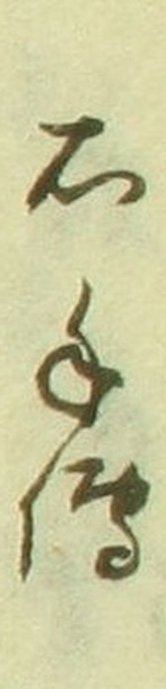右手伝
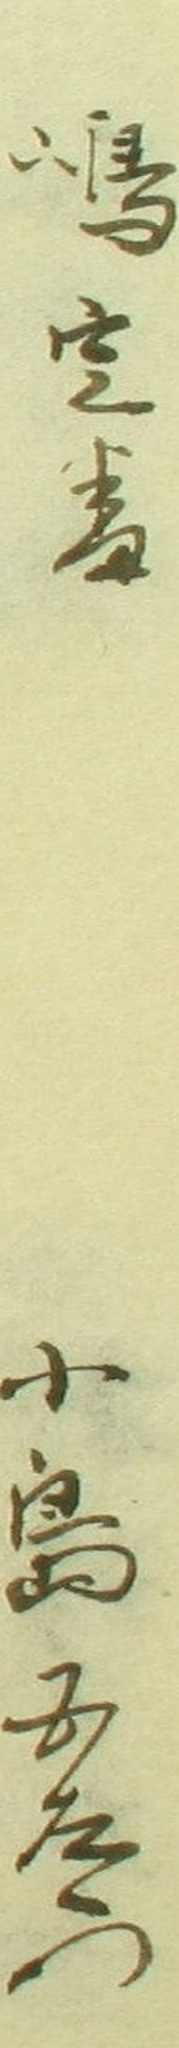島定番小島五左衛門
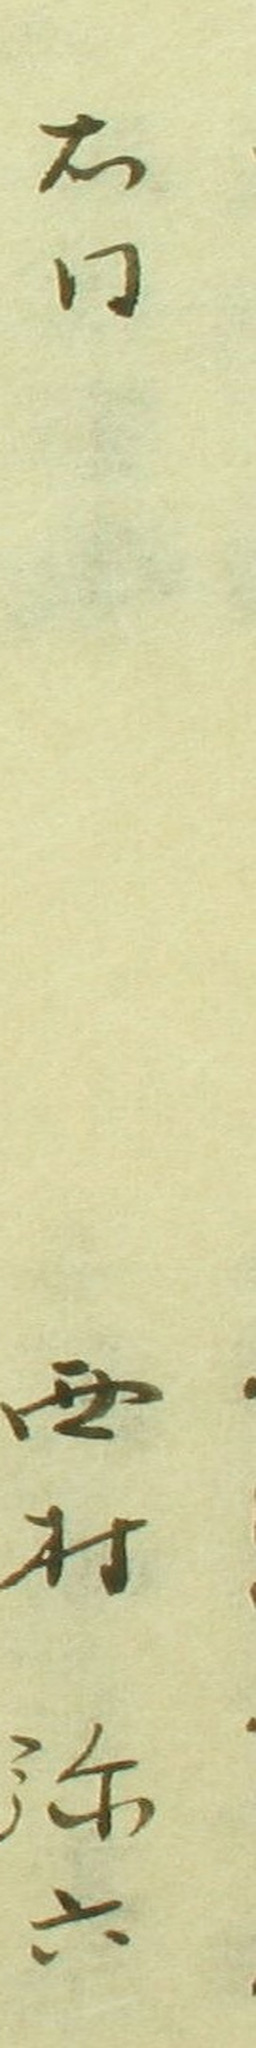右同西村弥六
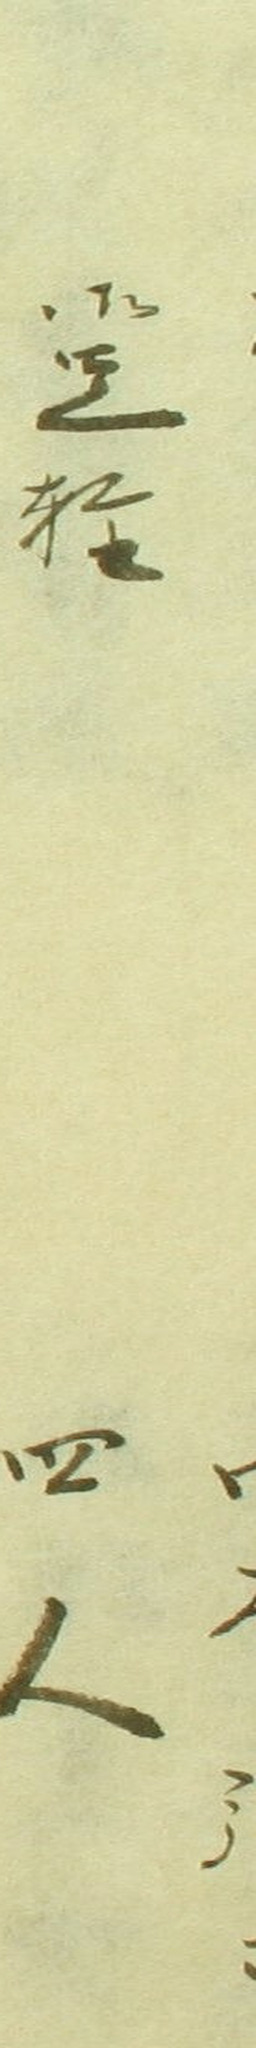御足軽四人
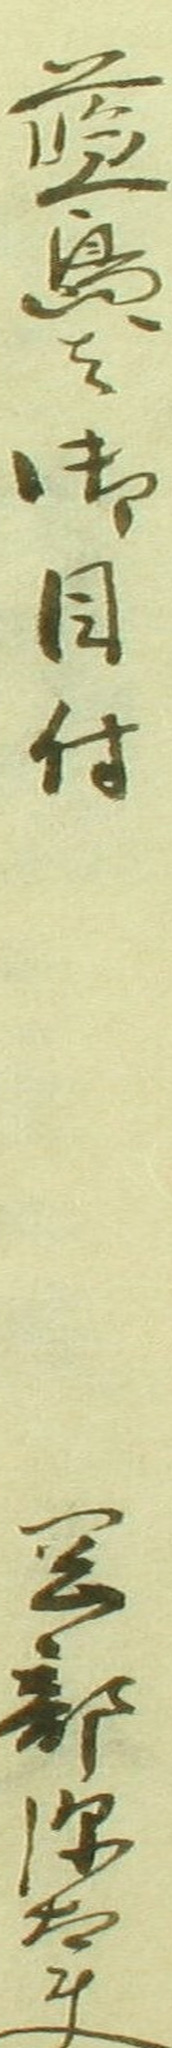藍島へは御目付岡部源太夫
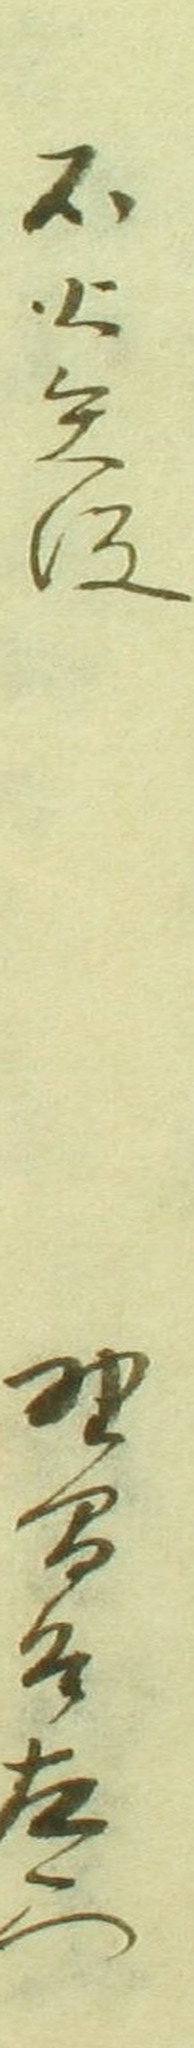右火矢役野間兵左衛門
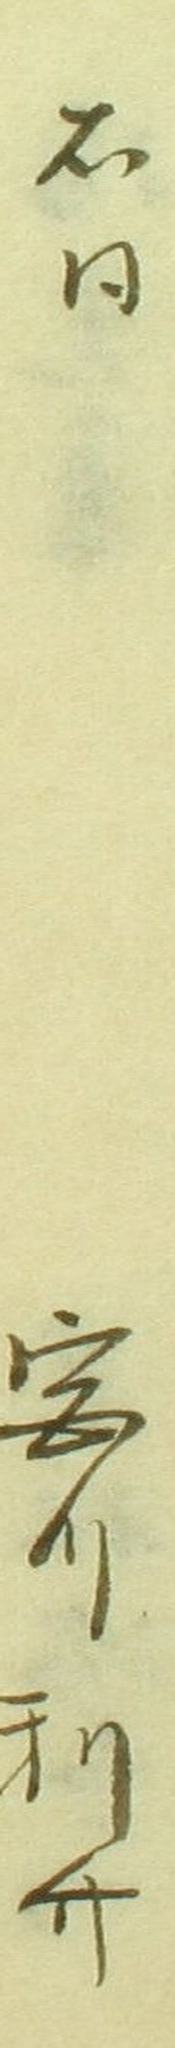右同宮川利介
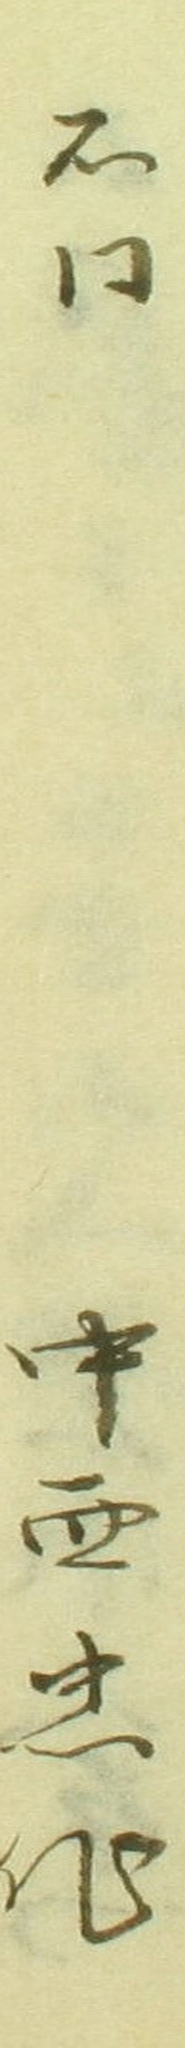右同中西忠作
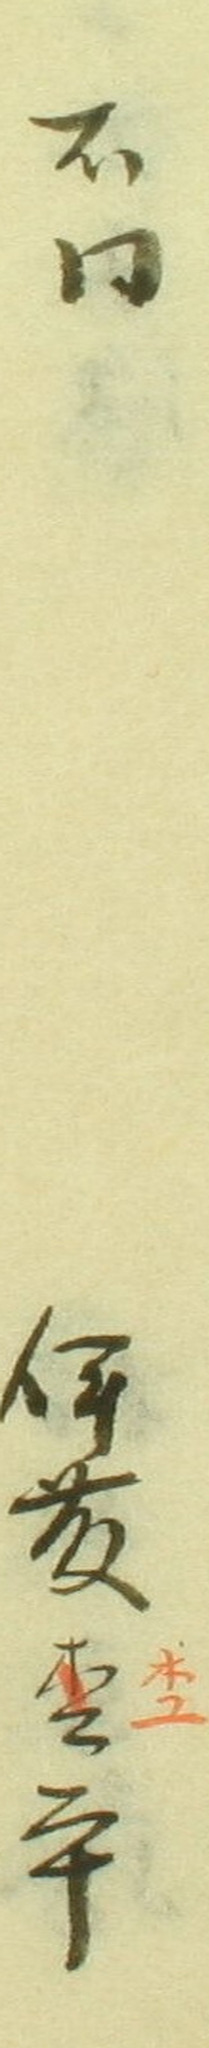右同伊藤杢平
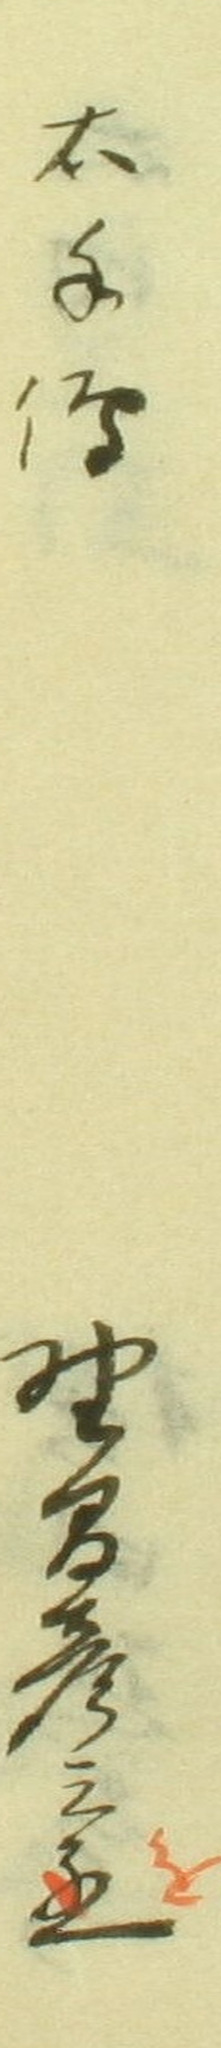右手伝野間彦之進
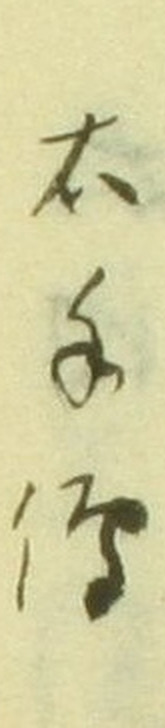右手伝
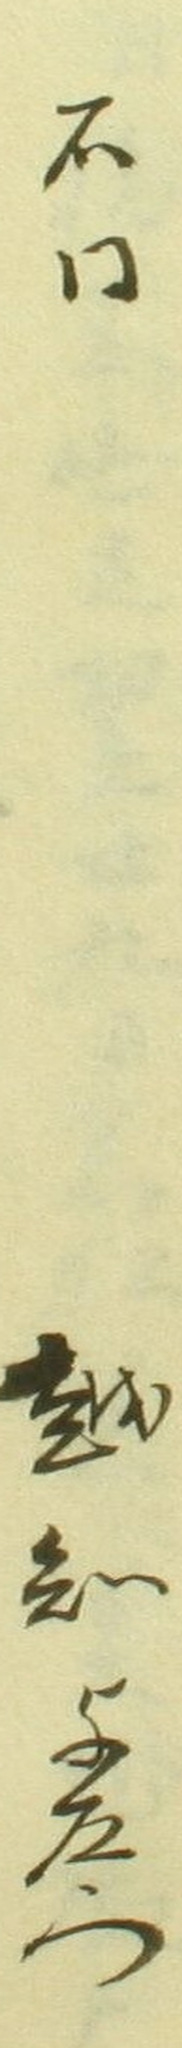右同越知与左衛門
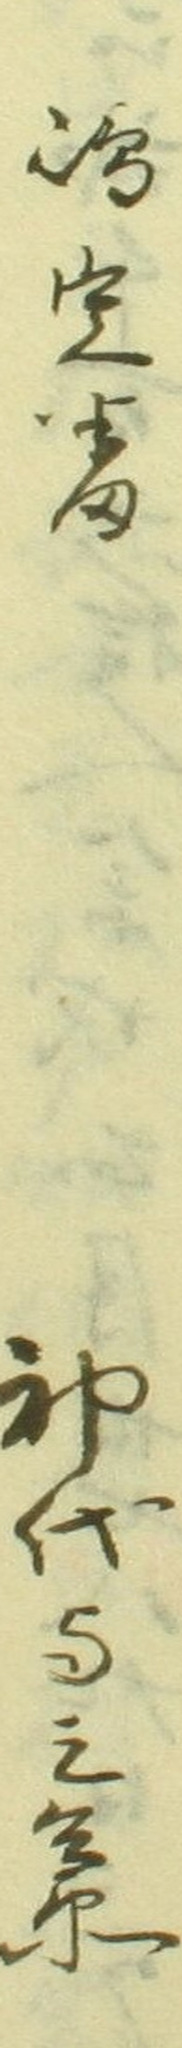島定番神代与之兵衛
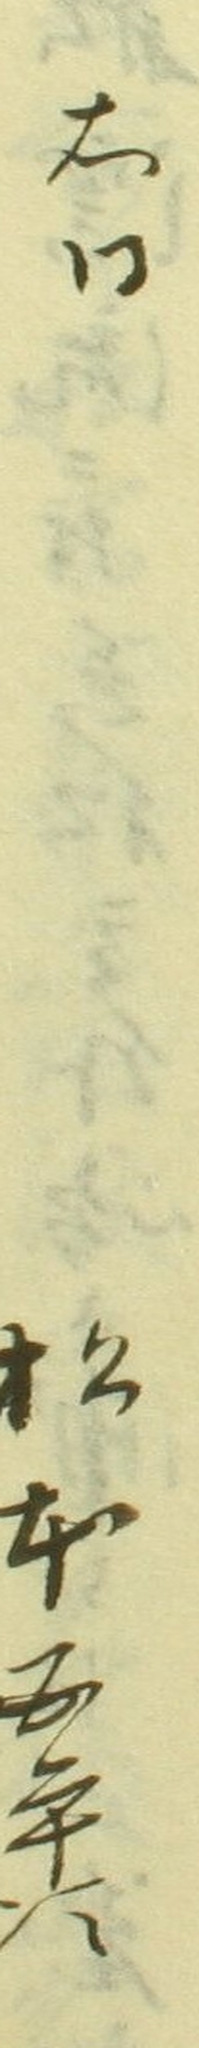右同松本五平次
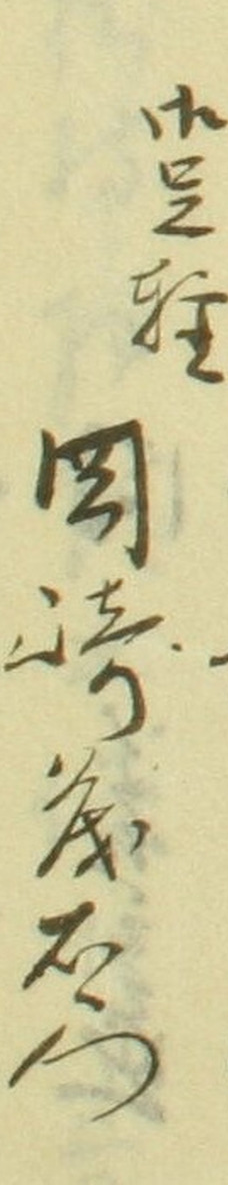御足軽岡崎茂右衛門

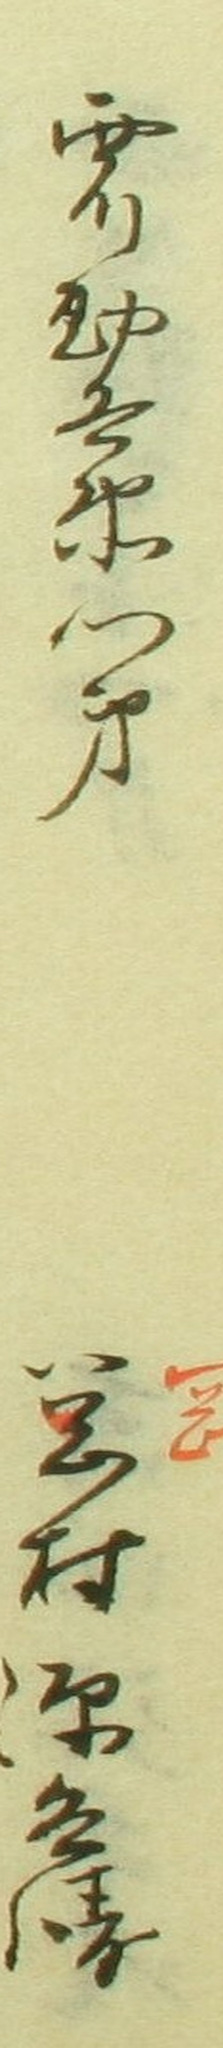西川勘兵衛門弟岡村源兵衛
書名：唐船漂流記 二
